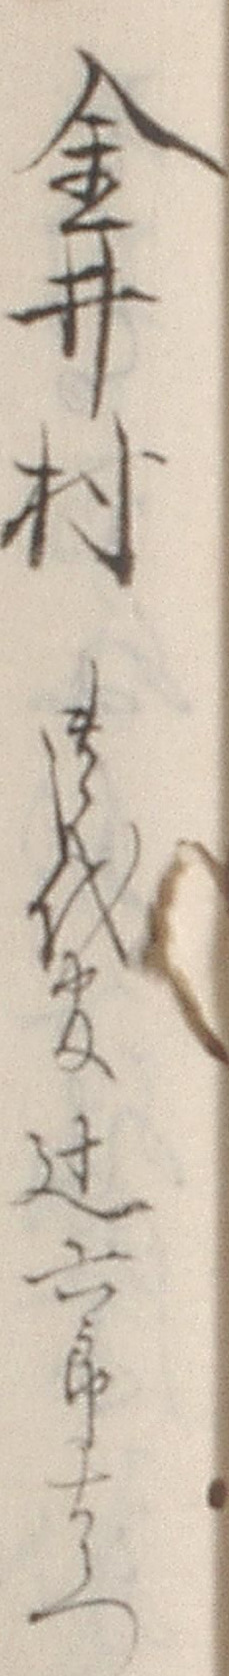金井村御代官辻六郎右衛門
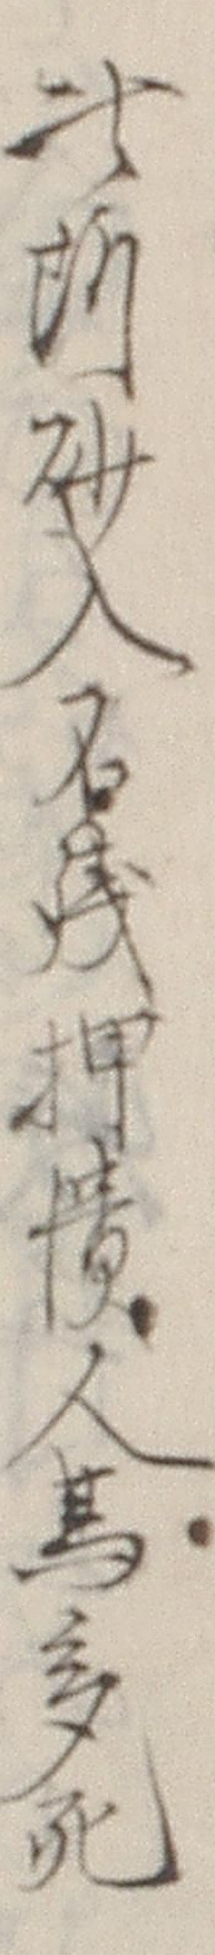此所砂入不残押潰人馬多死
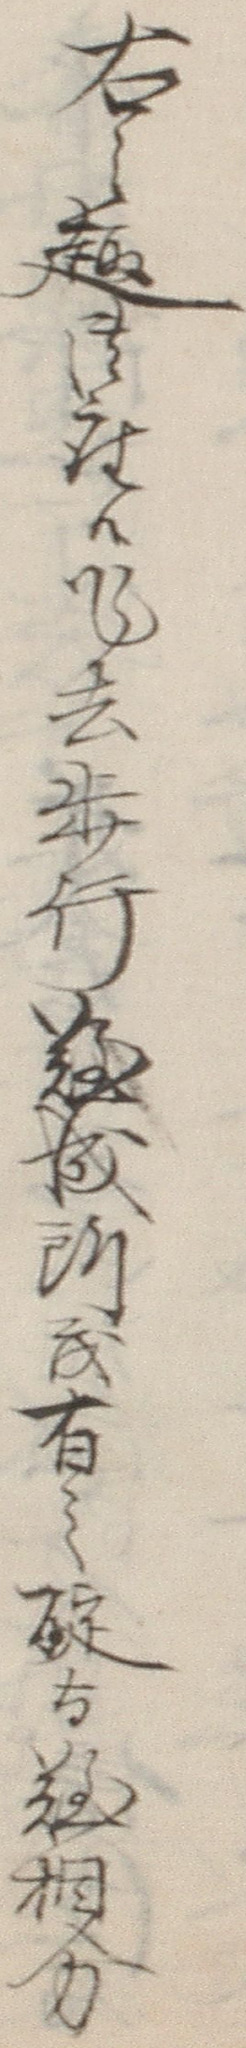右之趣御座候乍去歩行難成所も有之碇と難相分
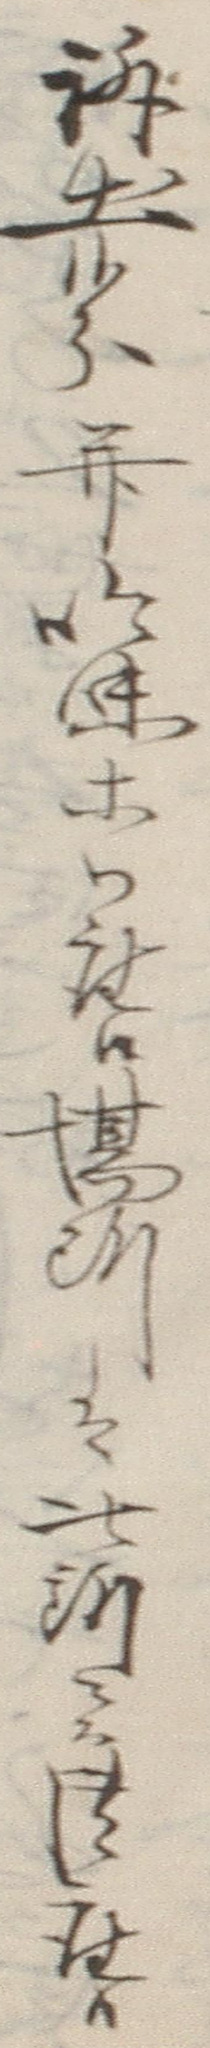訴出候分幷吟味等御座候場所は此所ニ而御座候
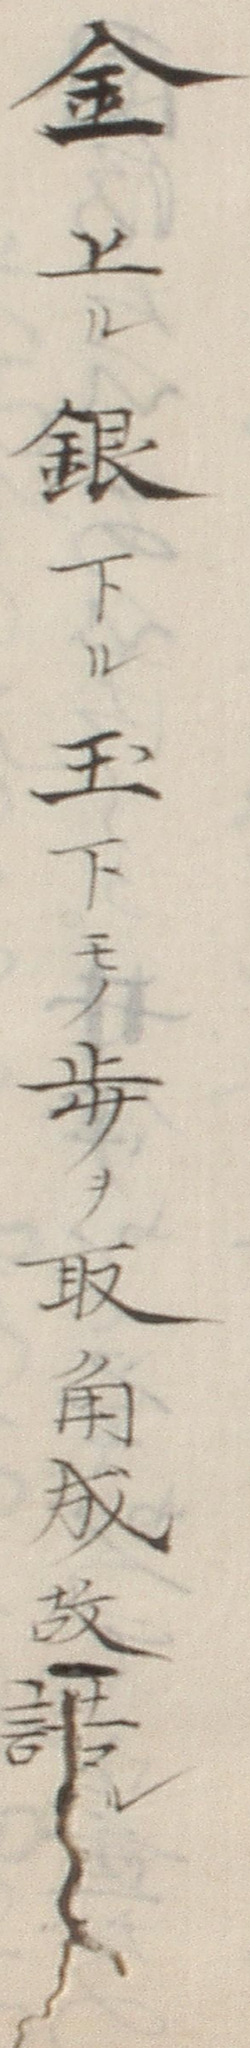金上ル銀下ル玉下モノ歩ヲ取角成故詰ル
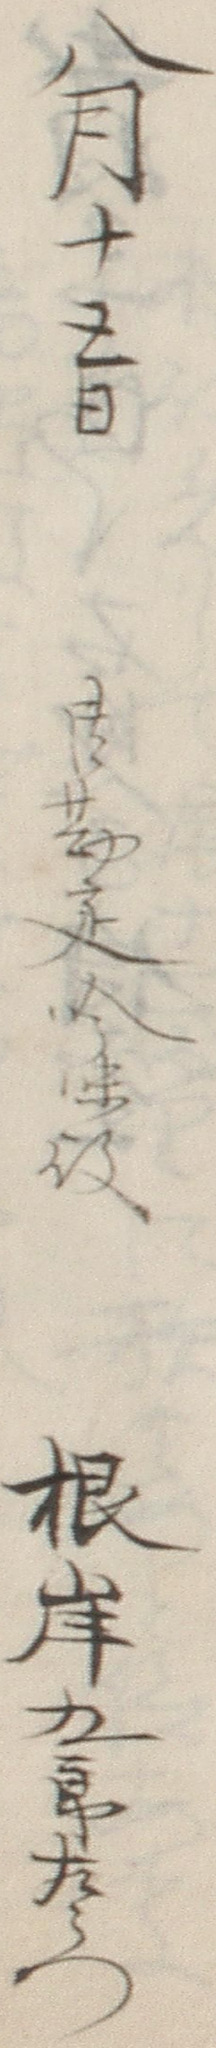八月十五日御勘定吟味役根岸九郎左衛門
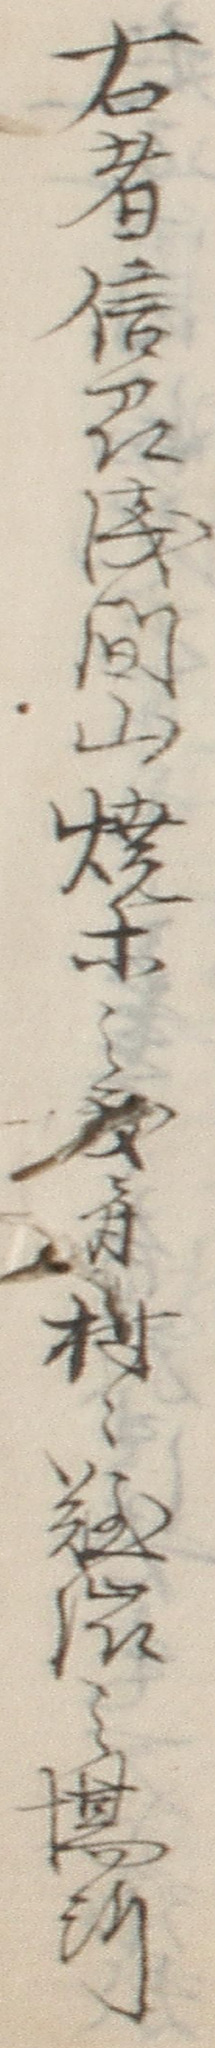右は信州浅間山焼等之義ニ付村々難渋之場所

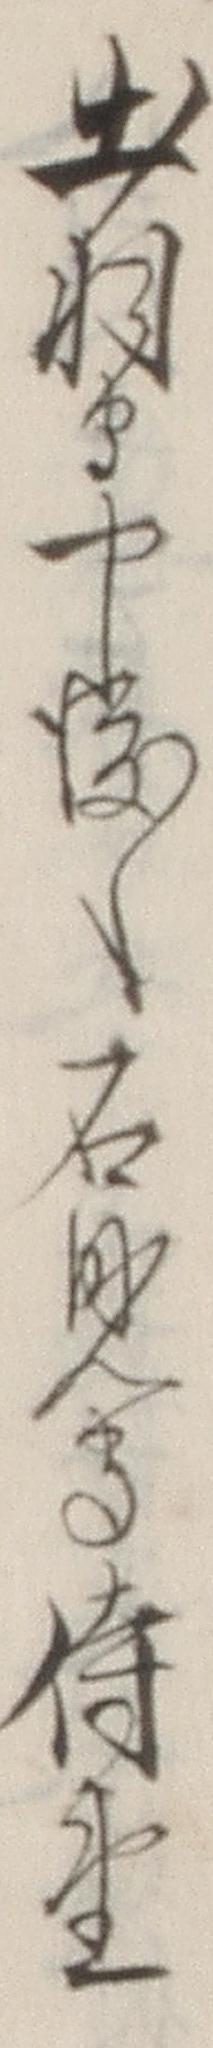出羽守申渡候石見守侍座
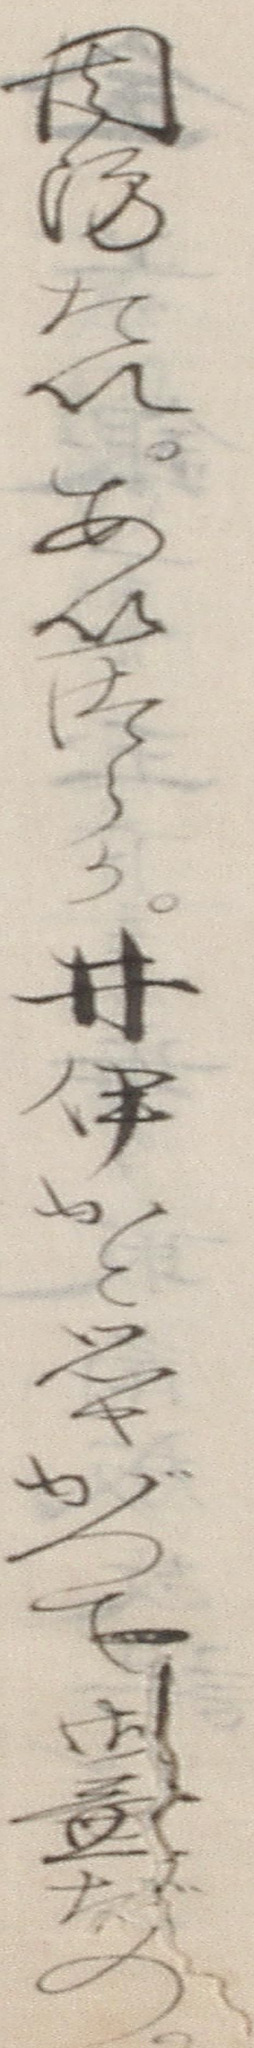周防たい。あいつらか。井伊かと思ヤがつて御益だの。
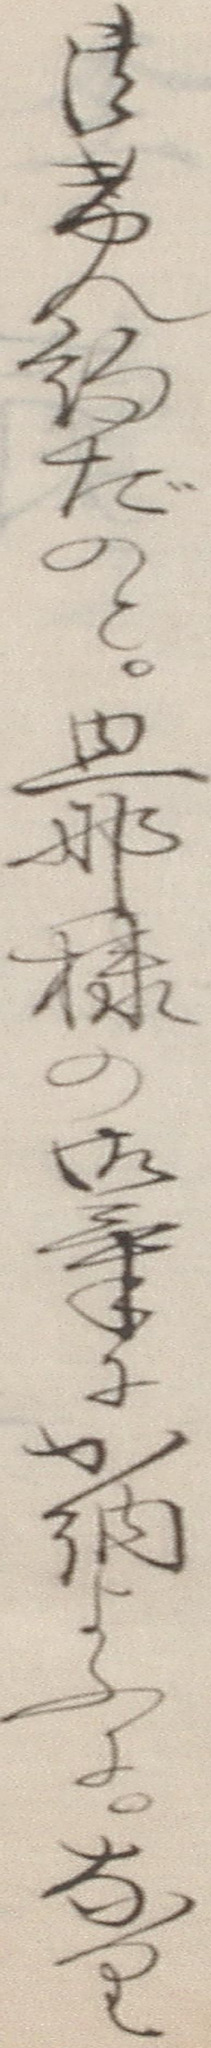御けん約だのと。旦那様の御気に加納よふに。なり
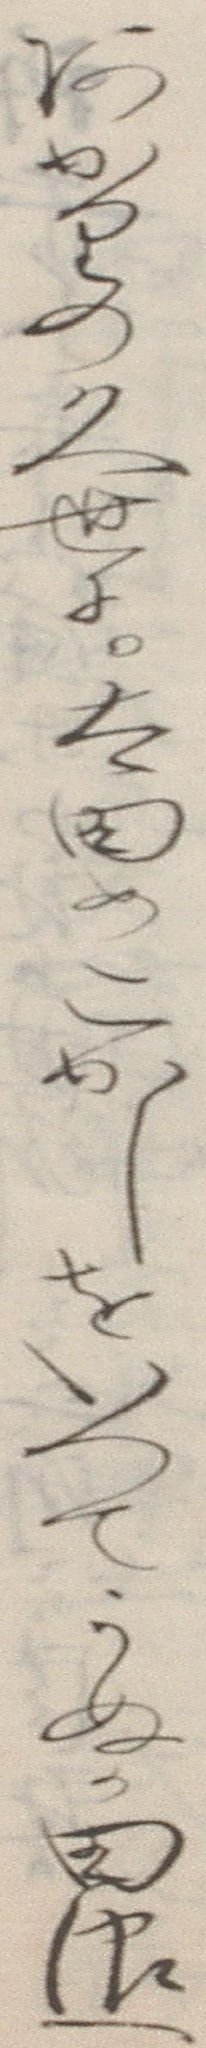あかりの久世に。太田めこかしをいつてうぬか田沼へ
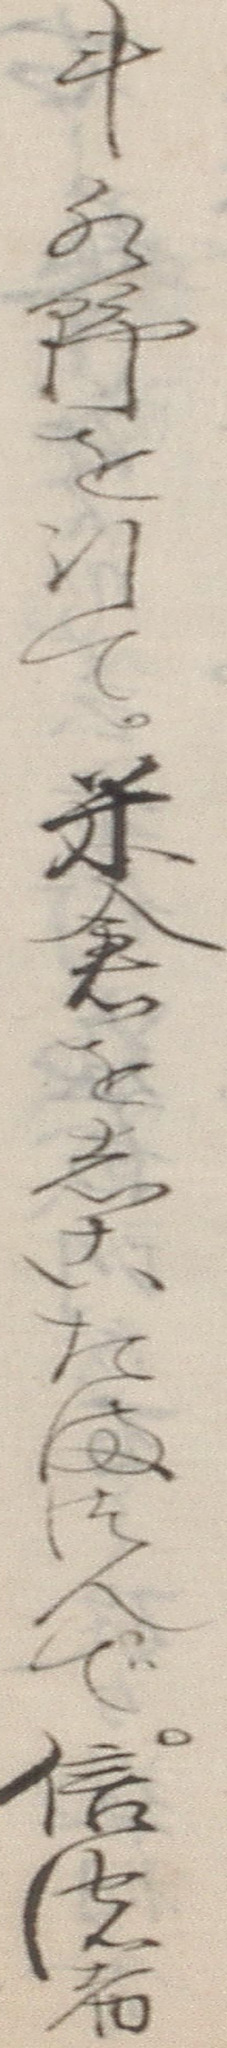斗水野を引て。米倉をしこたまつんで。信濃者
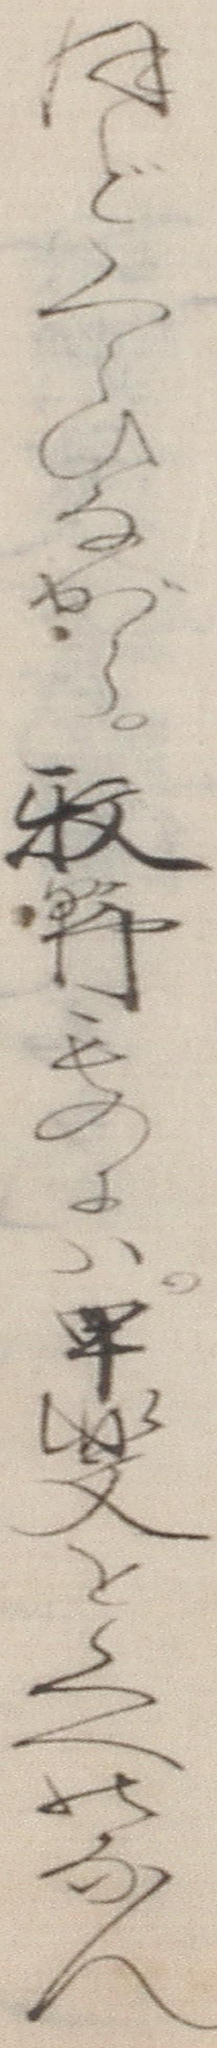ほどくらひながら。牧野ものにハ。甲斐とゝくへのなん
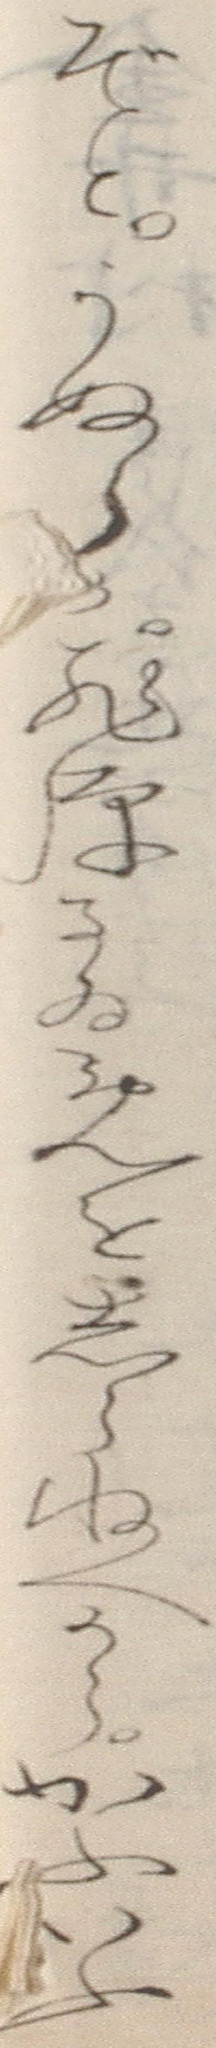ぞと。うぬら。飛彈るゐめをしらねへかし。かふいふ
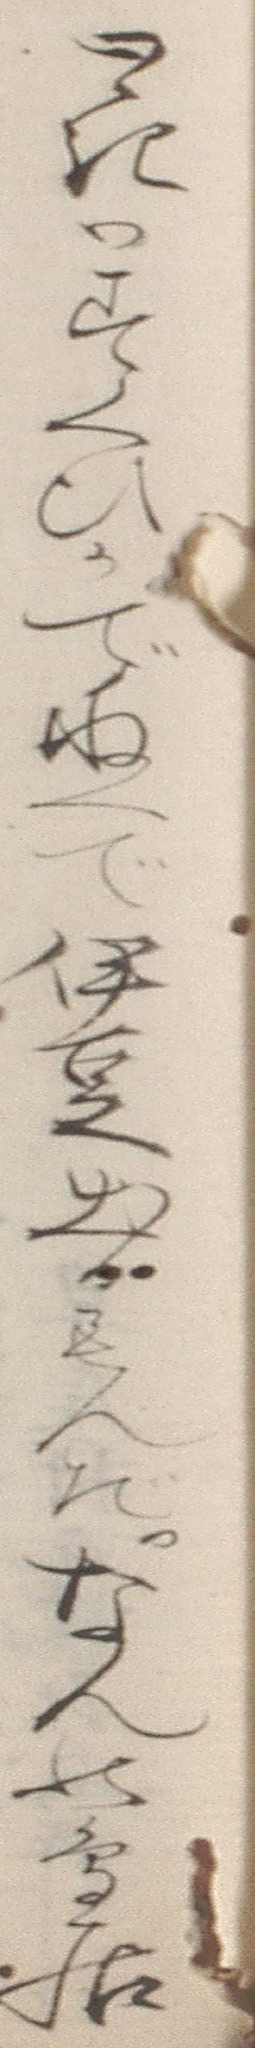ときわすくひかでねへで伊豆出るもんだ。なんの鳥居
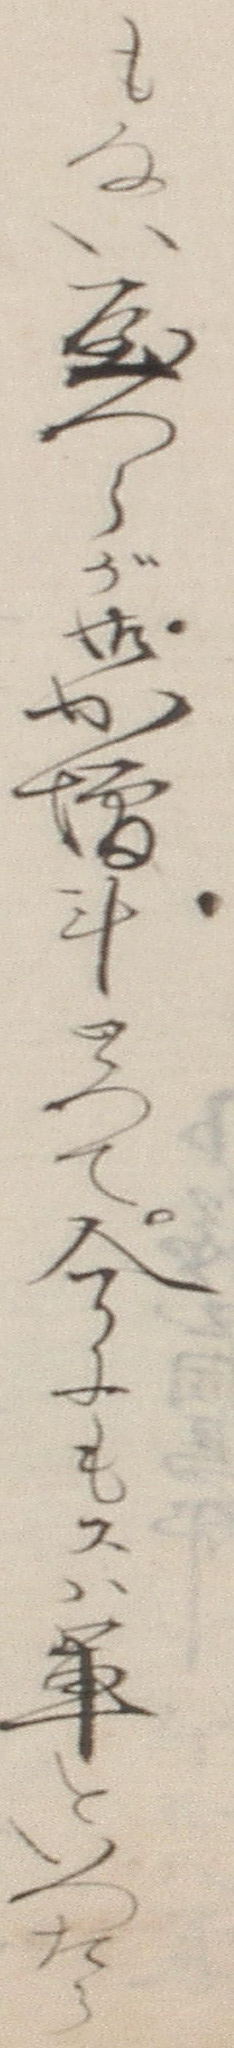もないやつらが御加増斗とつて。金子もスハ軍といつたら
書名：[諸国災害記録]
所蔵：東京大学地震研究所図書室 Earthquake Research Institute Library, The University of Tokyo, JAPAN
